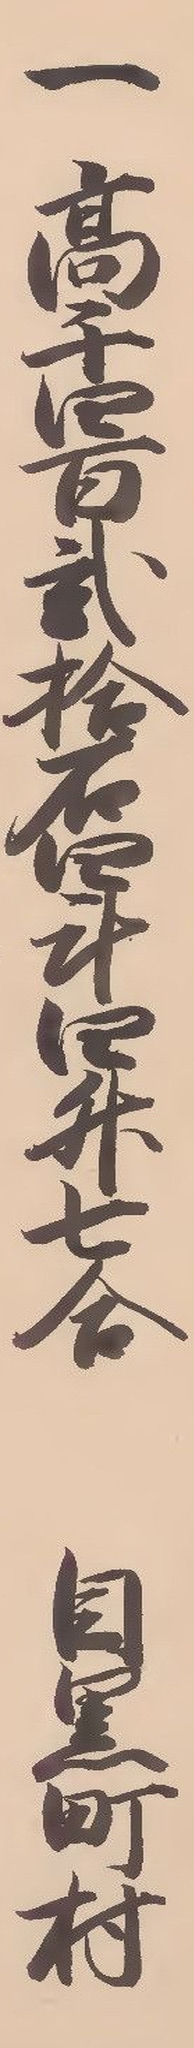一高千四百弐拾石四斗四升七合目黒町村
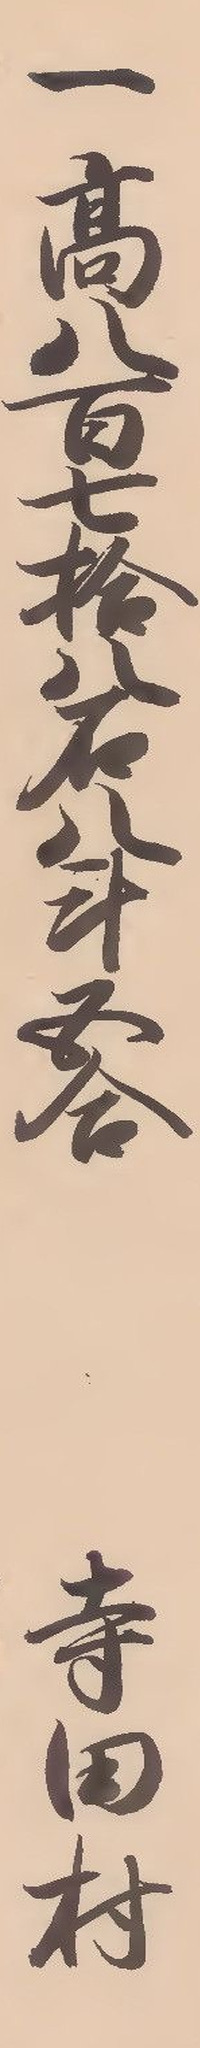一高八百七拾八石八斗五合寺田村
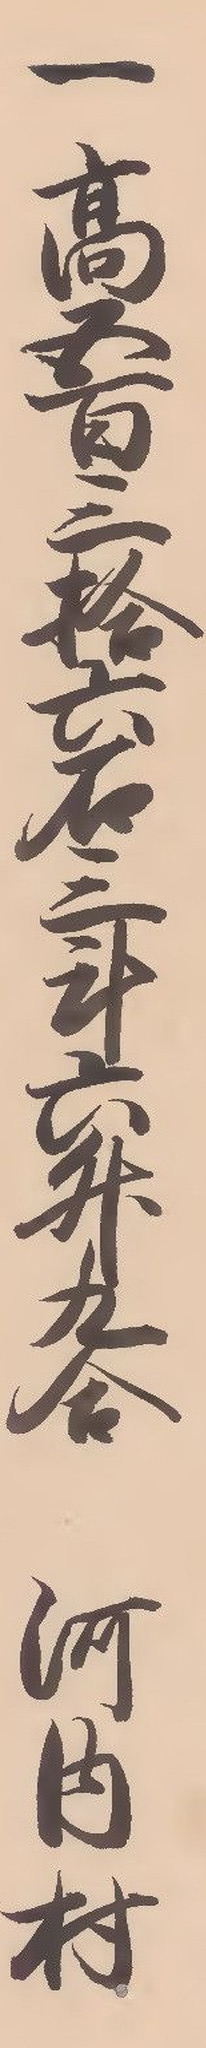一高五百三拾六石三斗六升九合河内村
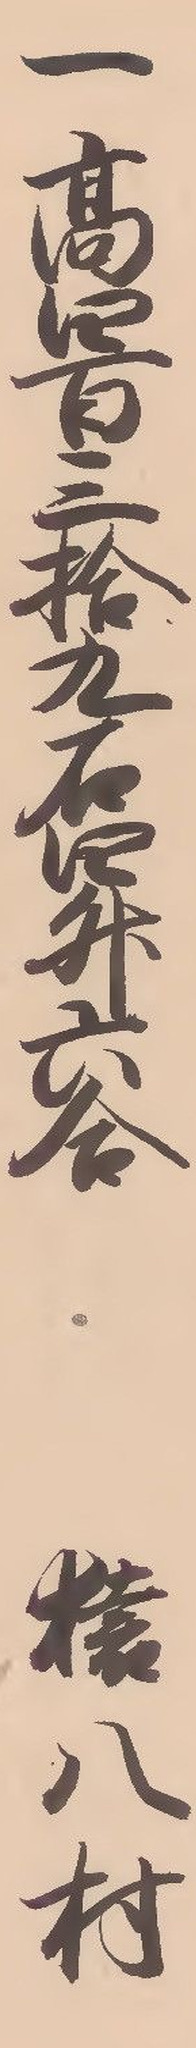一高四百三拾九石四升六合権八村

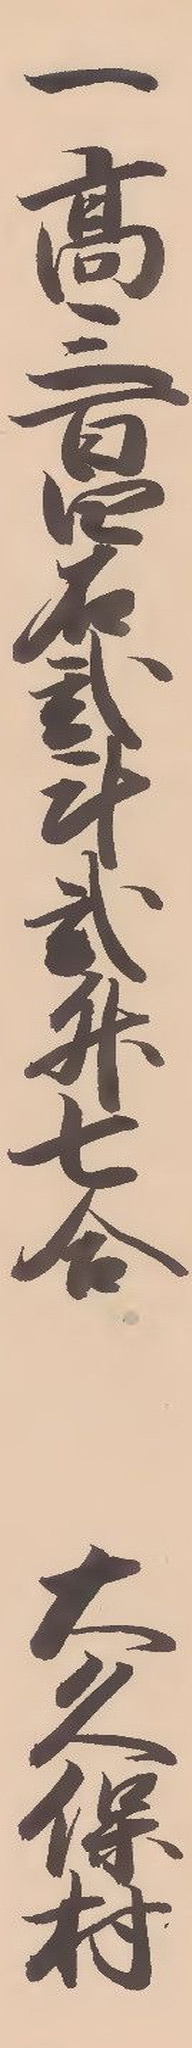一高三百四石弐斗弐升七合大久保村
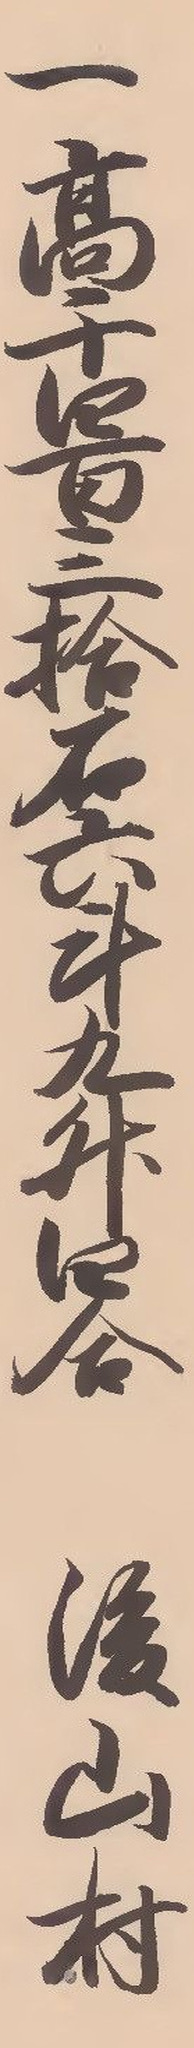一高千四百三拾石六斗九升四合後山村
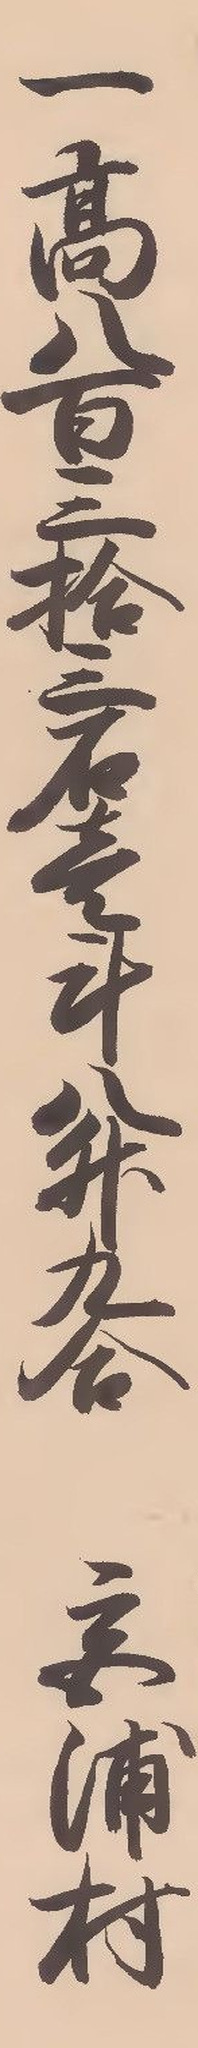一高八百三拾三石壱斗八升九合宮浦村
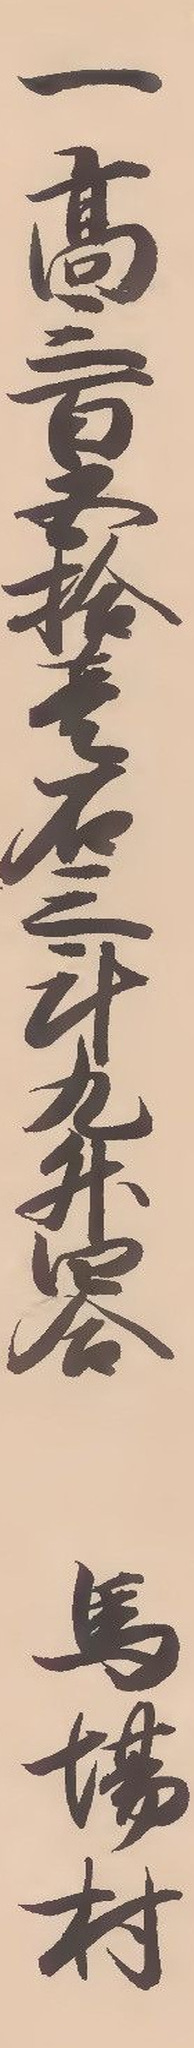一高三百五拾壱石三斗九升四合馬場村
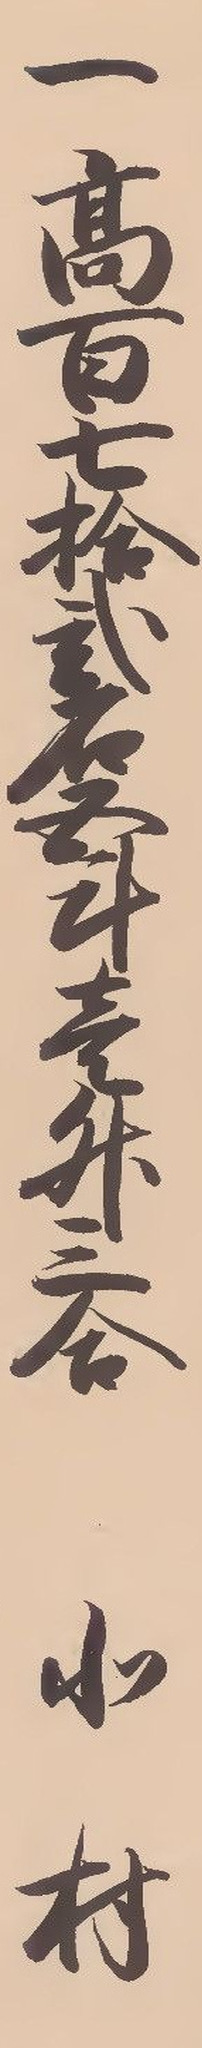一高百七拾弐石五斗壱升三合北村
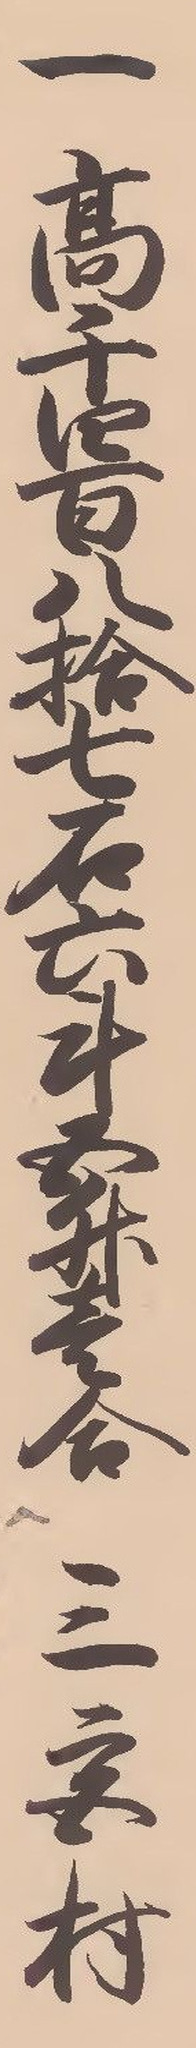一高千四百八拾七石六斗五升壱合三宮村
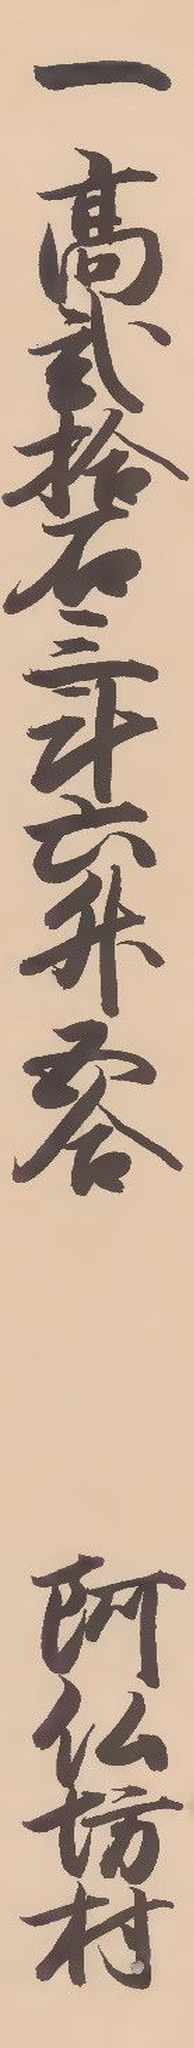一高弐拾石三斗六升五合阿仏坊村
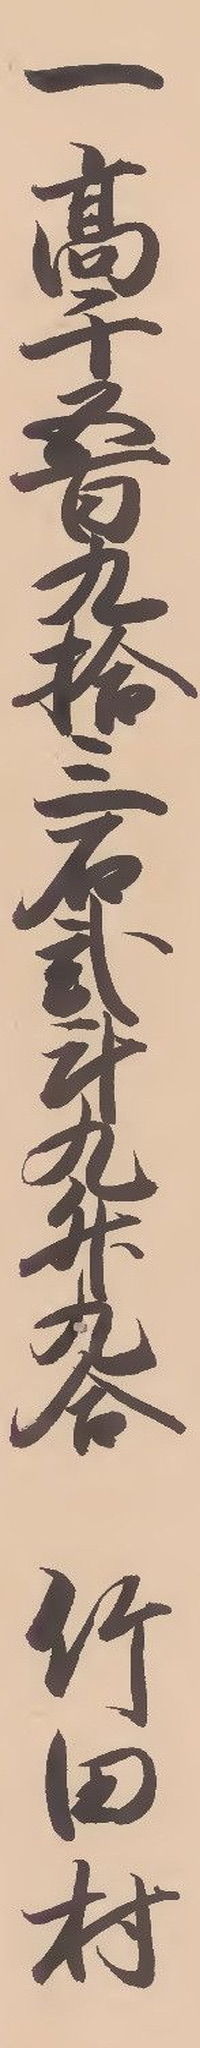一高千五百九拾三石弐斗九升九合竹田村

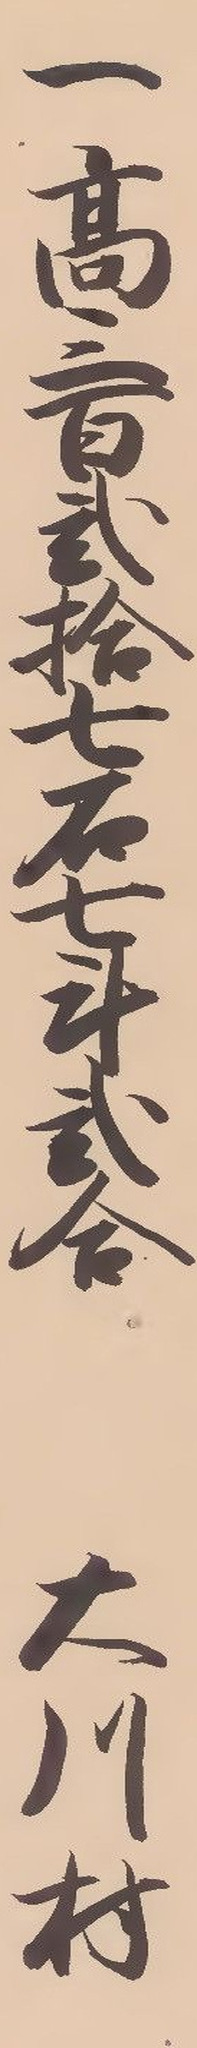一高三百弐拾七石七斗弐合大川村
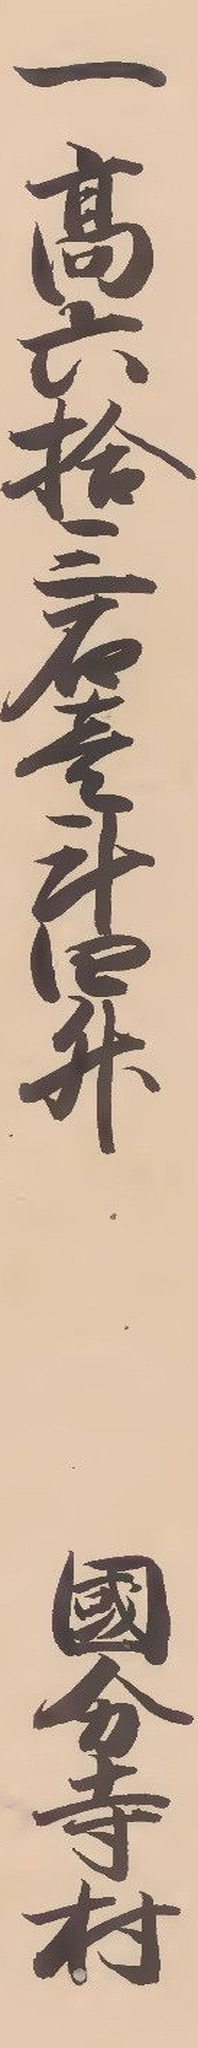一高六拾三石壱斗四升国分寺村
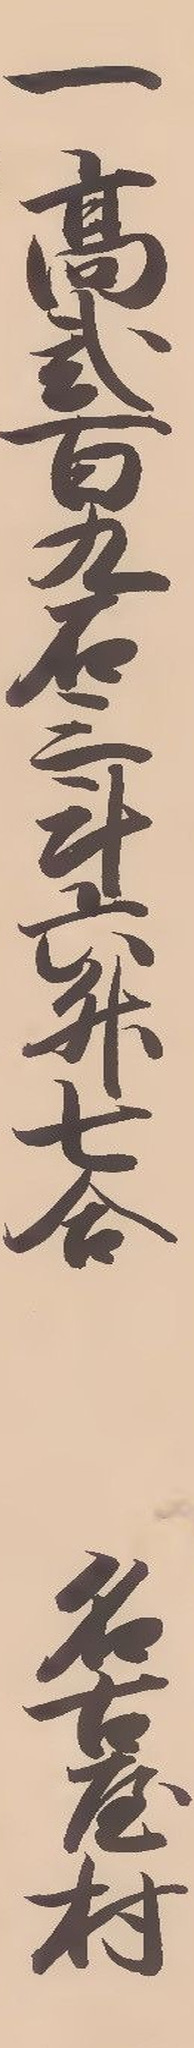一高弐百九石三斗六升七合名古屋村
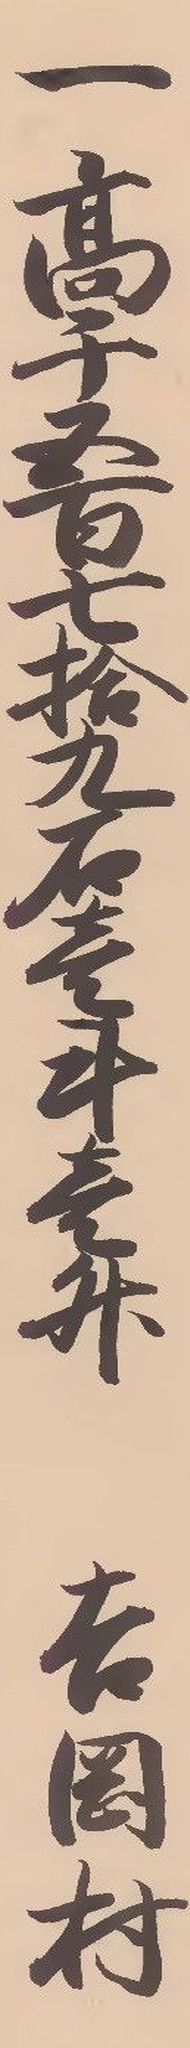一高千五百七拾九石壱斗壱升吉岡村
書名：佐渡国郷帳
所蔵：国立公文書館 National Archives of Japan
